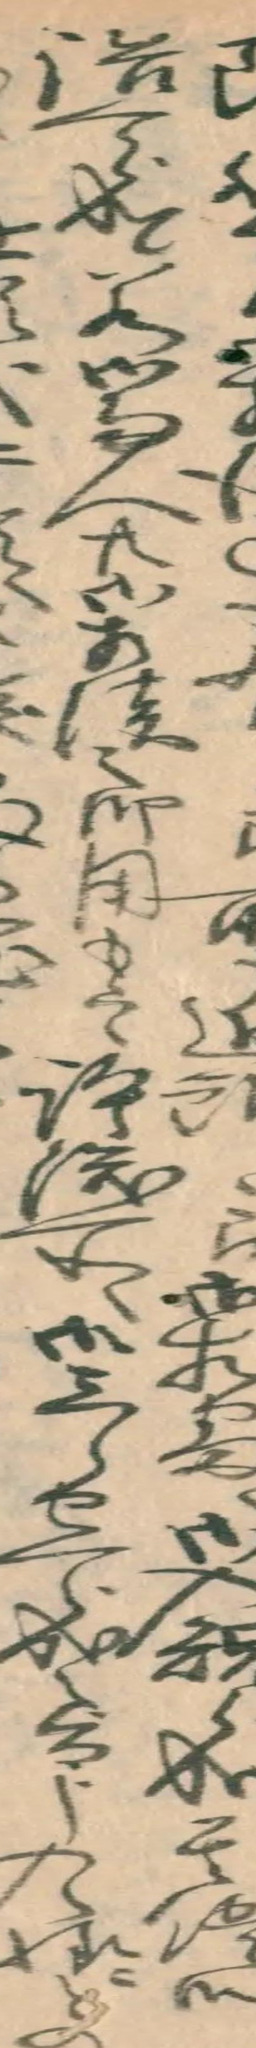詰可被成候若御両人共御相談之御用も候ハヽ評議所へ御しらせ可被成之旨申入候様ニとの
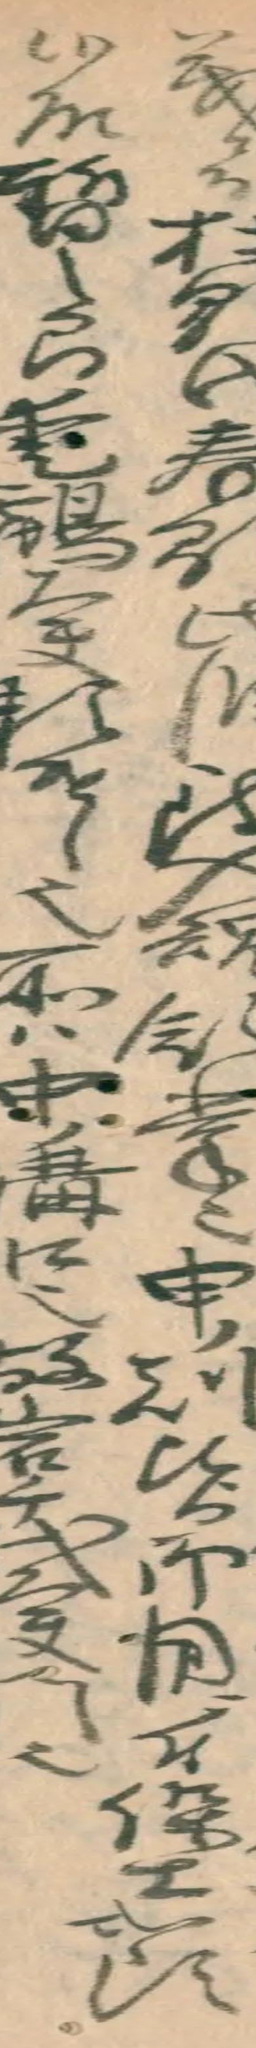候故暫之間愛鶴太夫頼遣し也所ハ中ノ溝口也故岩千代大夫門也
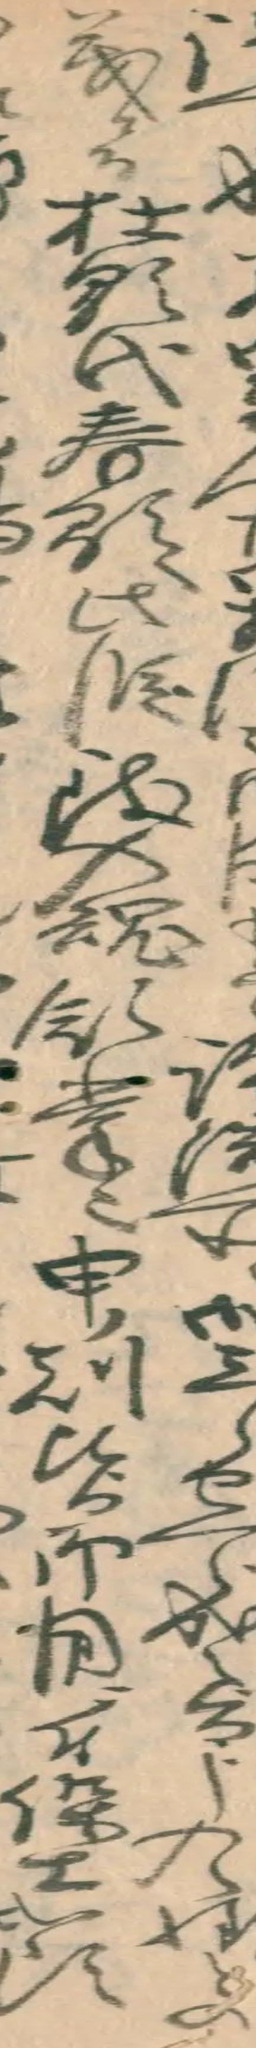義ニ而杜顕代春顕へ此段致入魂領掌也申ノ刻比ゟ御用ニ付保土出頭
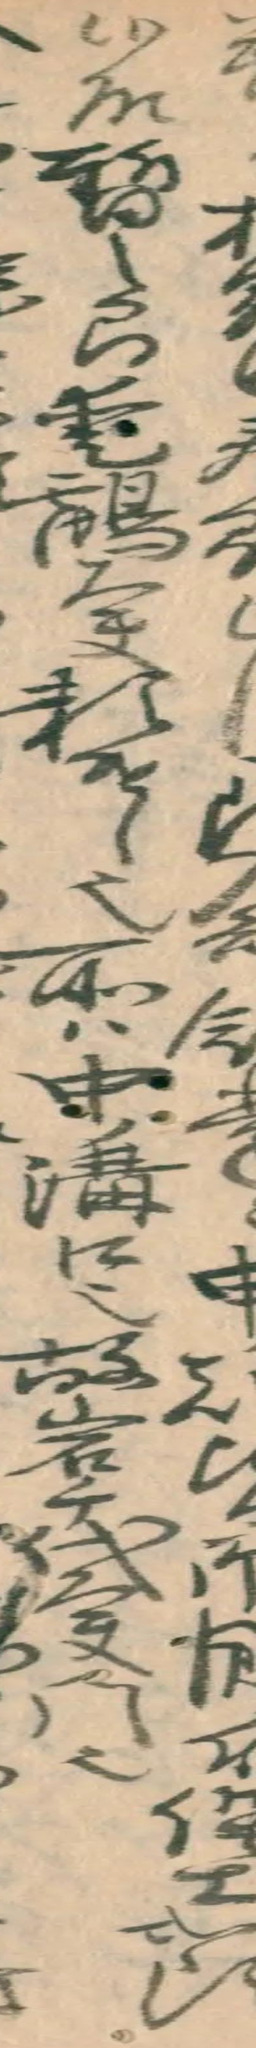候故暫之間愛鶴太夫頼遣し也所ハ中ノ溝口也故岩千代大夫門也
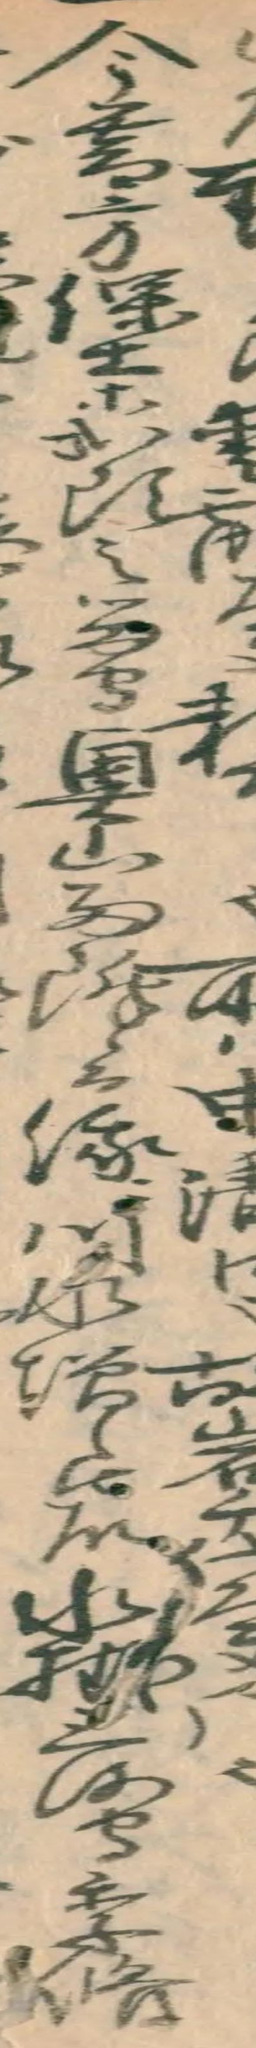一今暮方保土等出頭之留守奥山雨降候而俄ニ川水増候由故水掛三河守季脩
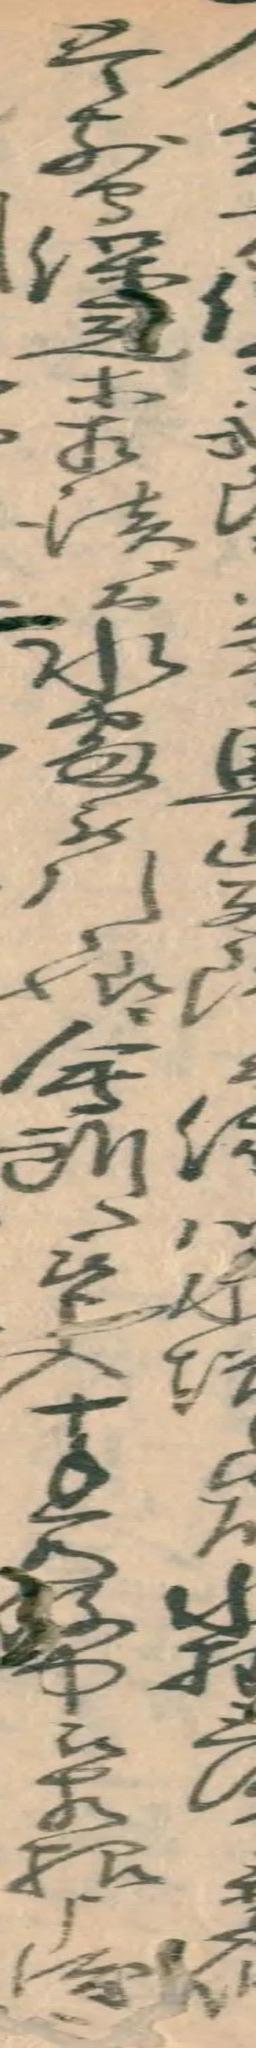豊前守保覚等相談ニ而水番被引候様ニ会所へ被申入十手若役中被相招申渡
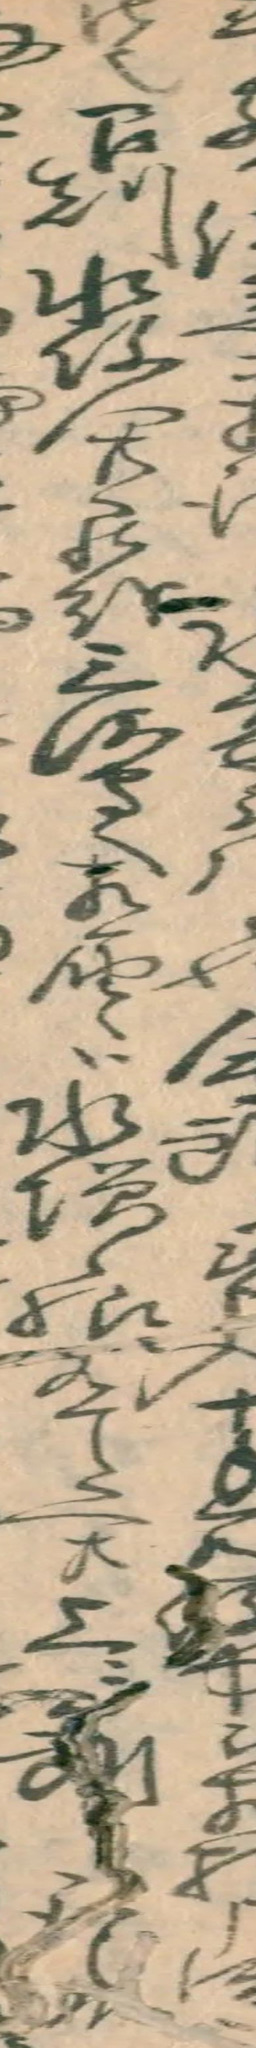由也即刻水役人共罷越三河守へ相届候ハ水増候様ニ有之候へ共上ニ故
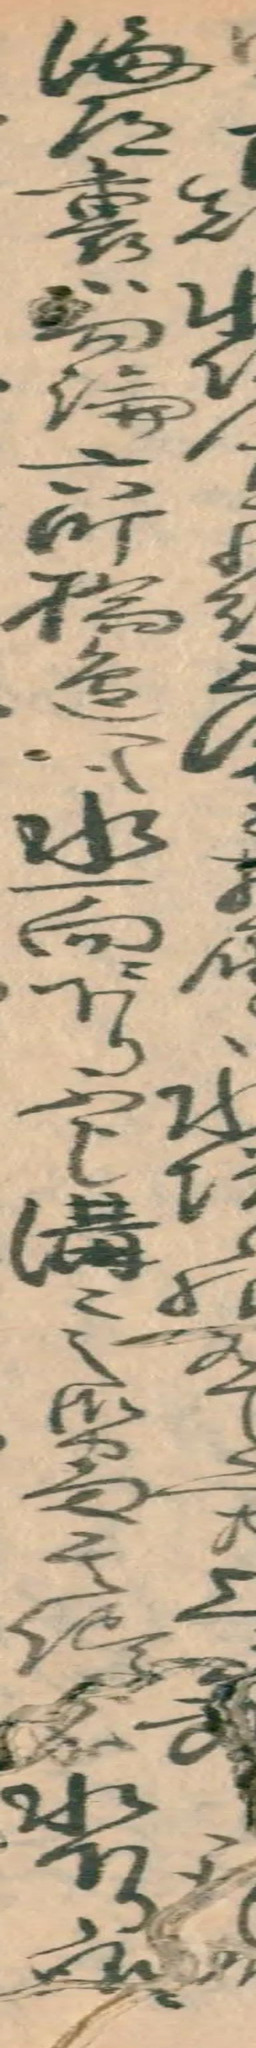海道裏ハ勿論六町橋辺へも水一向ニ下り不申候溝々之御番其侭被成水下り候様ニ
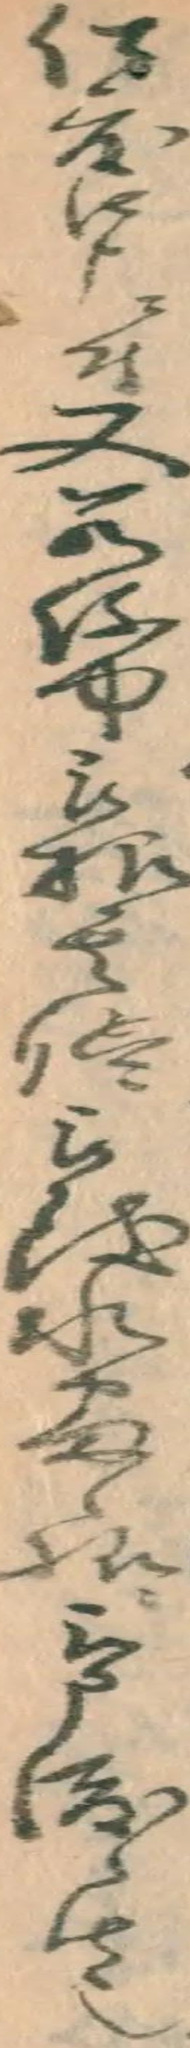待度由申ニ付又若役中被招其侭被致水番候様ニ申渡候由也
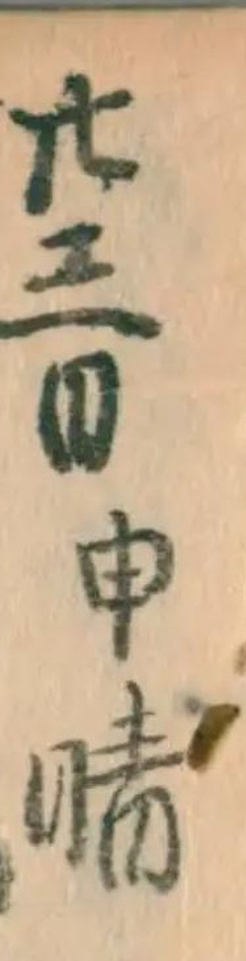廿三日申晴
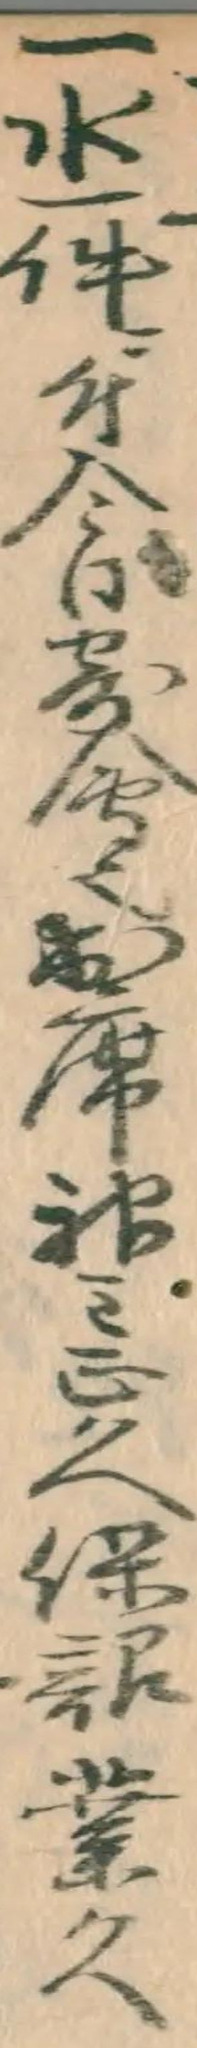一水一件ニ付今日寄会也出席神主正久保韶業久
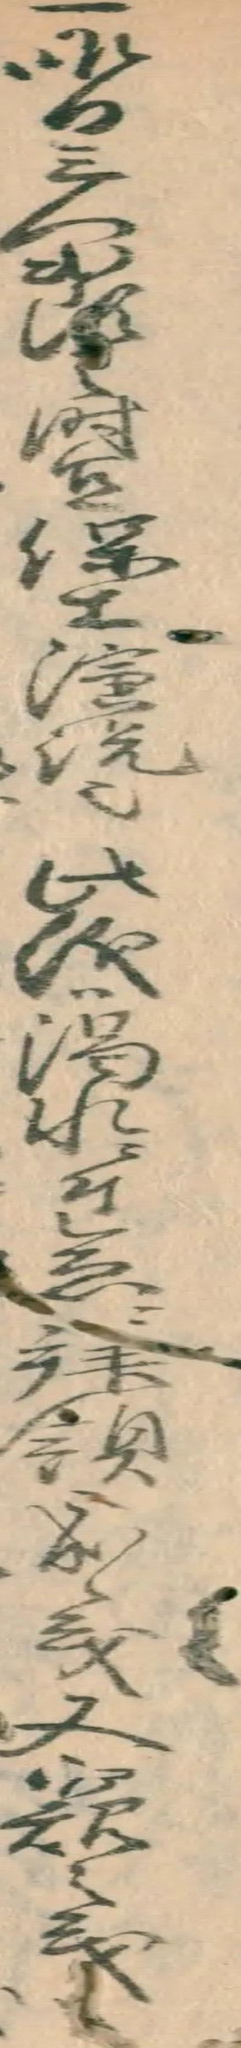一昨日三人出頭之時宜保土演説也此儀ハ渇水ニ付急ニ拝領被成候義又窺之義
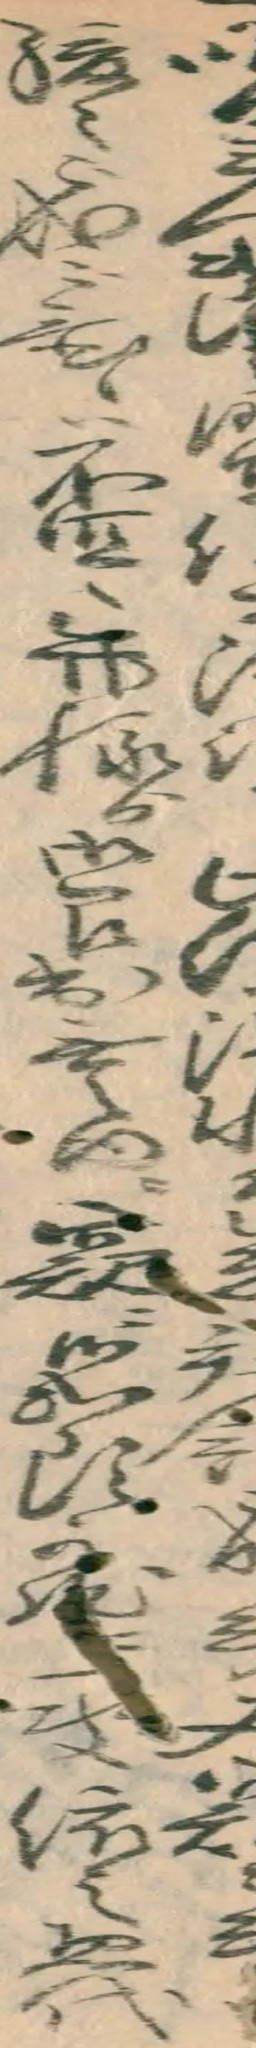緩々被成被置候ハ不宜候弁様ゟ御召出無之内ニ窺ニ御出頭可然ニ一決依之惣代
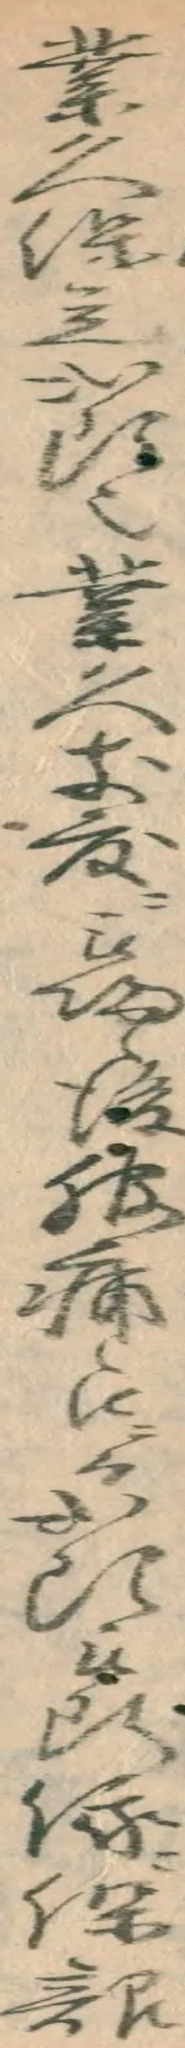業久保覚出頭也業久支度ニ被帰候後腹痛候由ニ而出頭被断俄ニ保韶
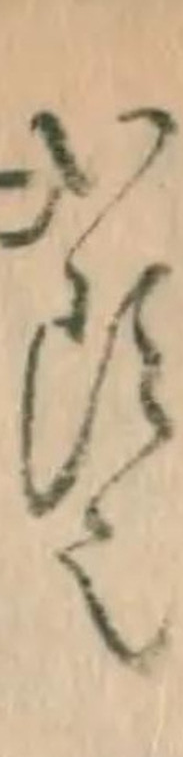出頭也
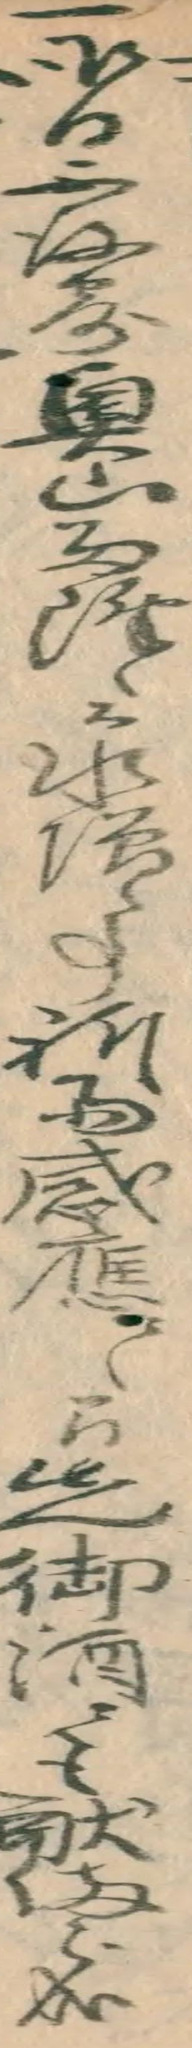一昨日不存寄奥山雨降候而水増候事祈雨感応ニ候間先御酒ニても献備被成
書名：賀茂社記録. 第58冊
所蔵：国立国会図書館 National Diet Library, JAPAN
